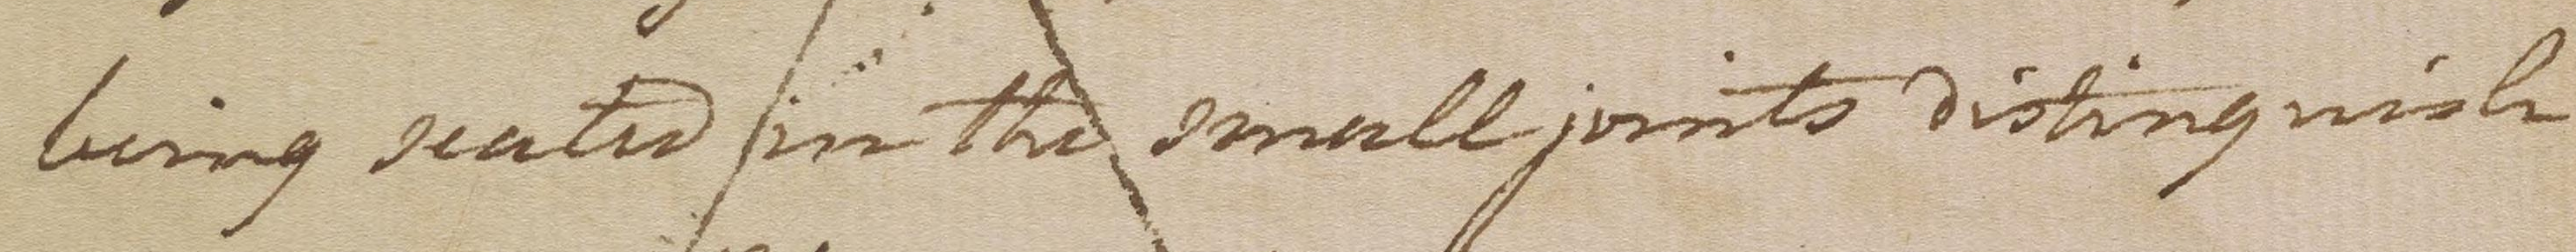being seated in the small joints distinguish
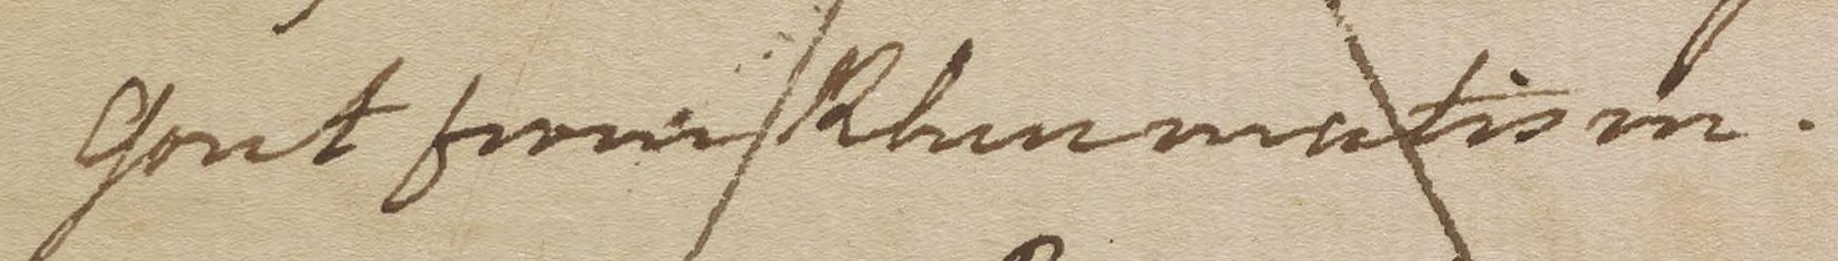gout from rheumatism.
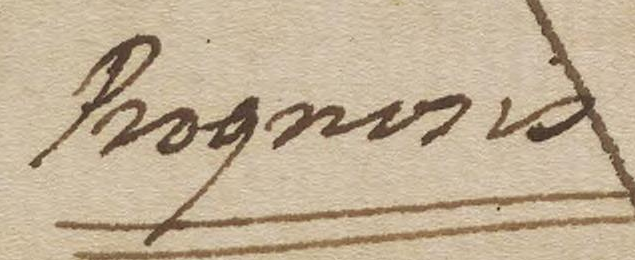Prognosis
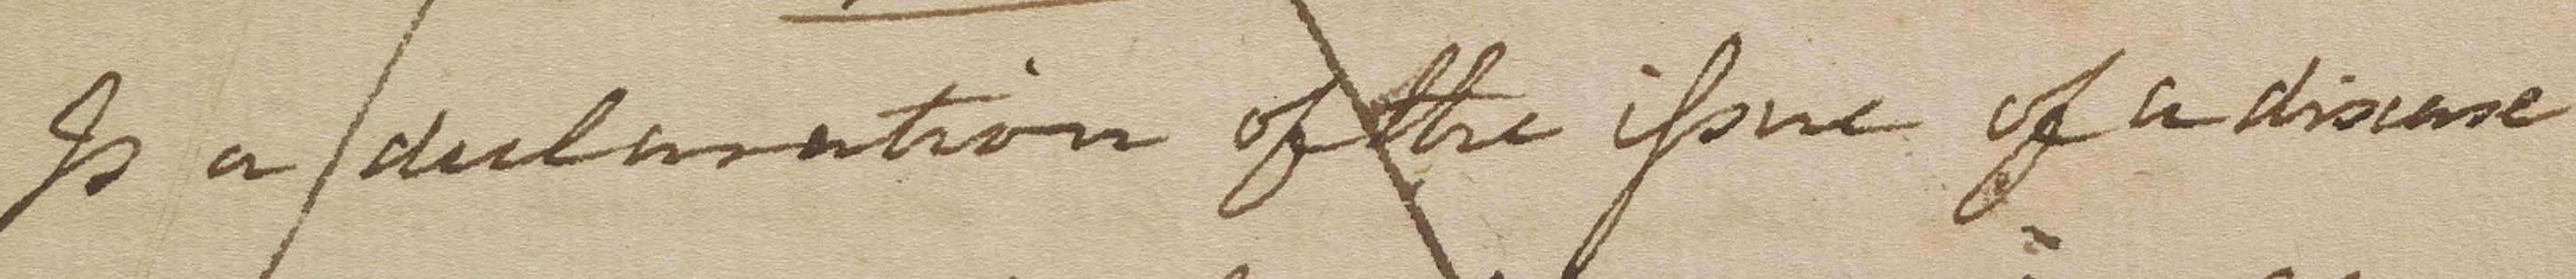Is a declaration of the issue of a disease
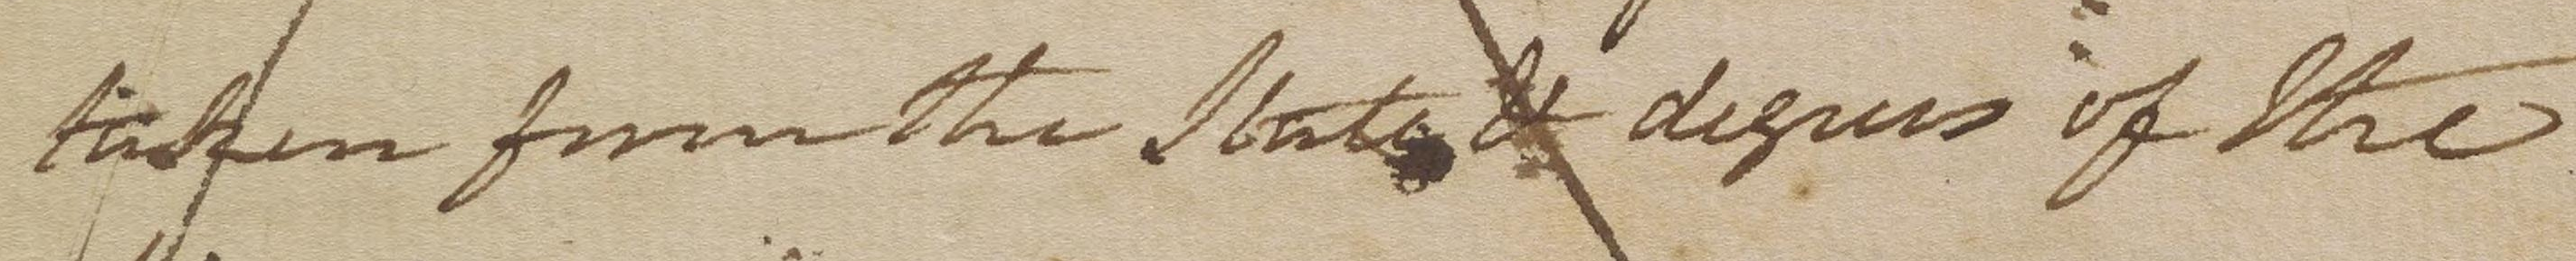taken from the state of degrees of the
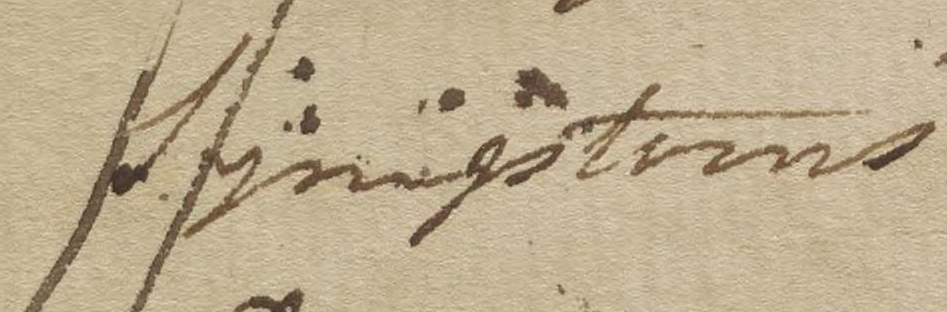symptoms.
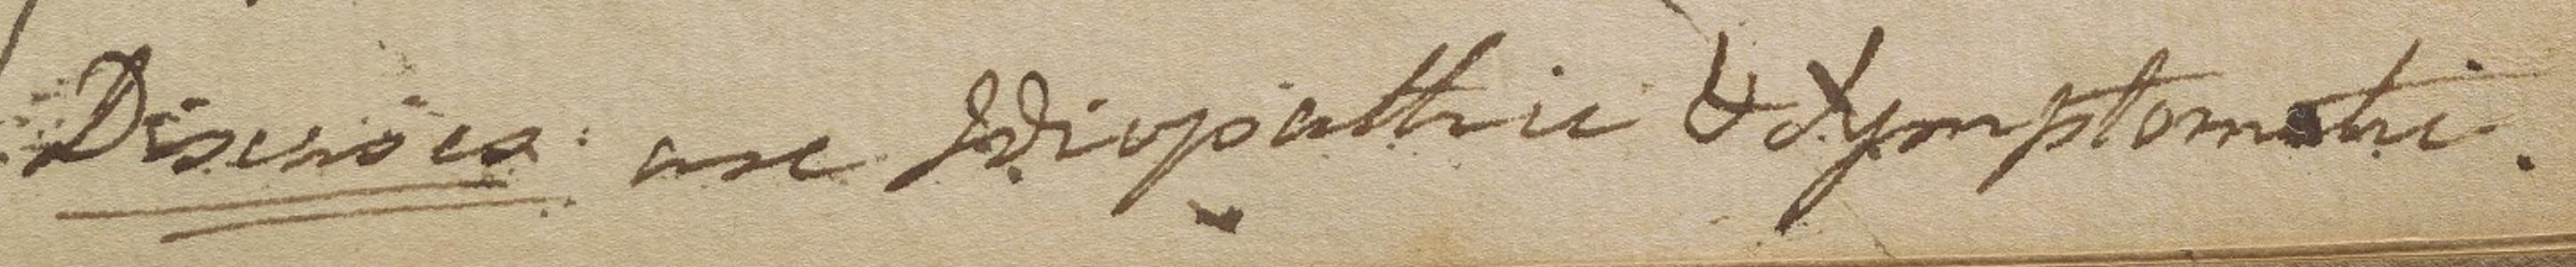Diseases are Idiopathic & symptomatic.
